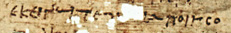εκεινωιτε ιαποιηϲο
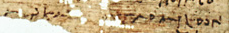μ νκα γαρμικρον
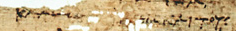καλωϲ ειϲκαιτουϲ
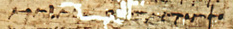αραβαϲ π αϲτομφο
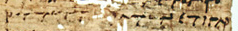ρο των ατωνετιγαρ
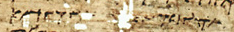καινυν υϲιντα
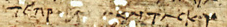τεπρ α καιταϲκου
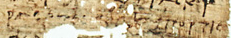ραϲο πορτιϲ
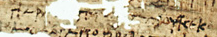παρ π υκεκο
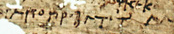αποπροβατ ν λα
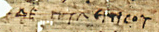δε πταεπιϲου
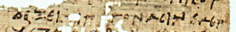δεξει ιγ γοναϲινελεγ
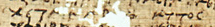χετα αυτοϲ
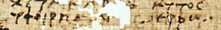υφειρη ερρω
